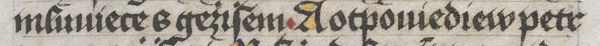mluuíece s geżíẛem.A otpouiediew petr
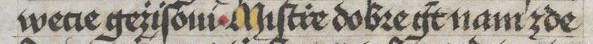wecie gežíẛoui.Miſtṙe dobre ḡt nam zde
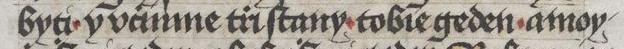byti.y vċinme tṙi ſtany.tobie geden.a moy¬
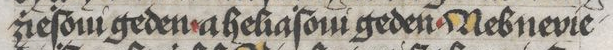žíeẛoui geden.a heliaẛoui geden.Neb nevíe¬
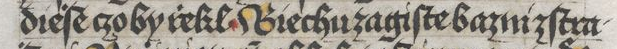díeẛe czo by ṙekl.Bíechu zagiſte bazní zſtra¬
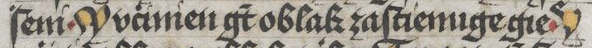ẛení.Y vċinieti ḡt oblak zaſtienuge gie.Y
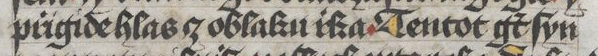pṙigide hlas z oblaku ṙka.Tentot ḡt ſyn
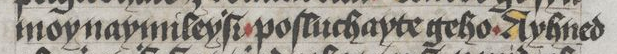moy naýmileyẛi.poſluchayte geho.Ayhned
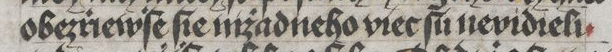obezṙíewẛe ſie niżadneho víec ſu nevidieli.
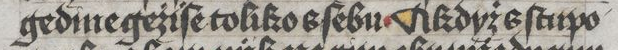gedinie geżíẛe toliko sſebu. Akdyż sſtupo¬
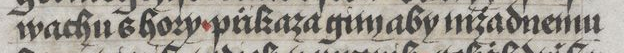wachu s hory.pṙikaza gím aby niżadnemu
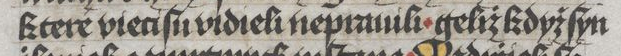které vieciſu vidieli neprauli.geliż kdyż ſyn
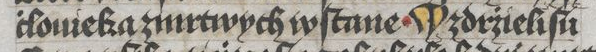ċlouieka z mrtrých wſtane.Yzdrżieli ſu
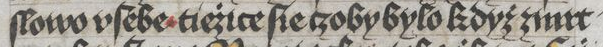ſlowo vſebe.tieżíce ſíe czoby bylo kdyż zmrt¬
